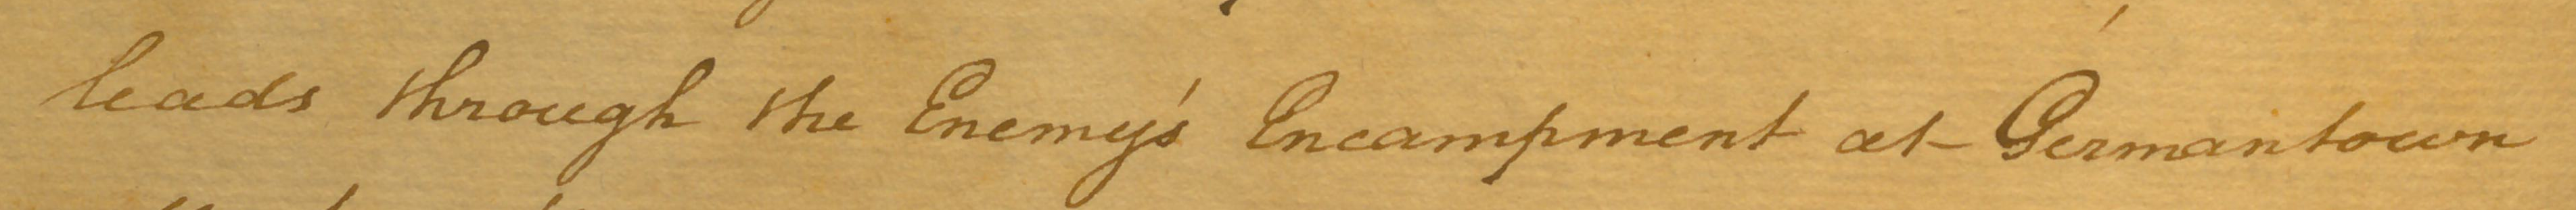lead through the Enemy's Encampment at Germantown
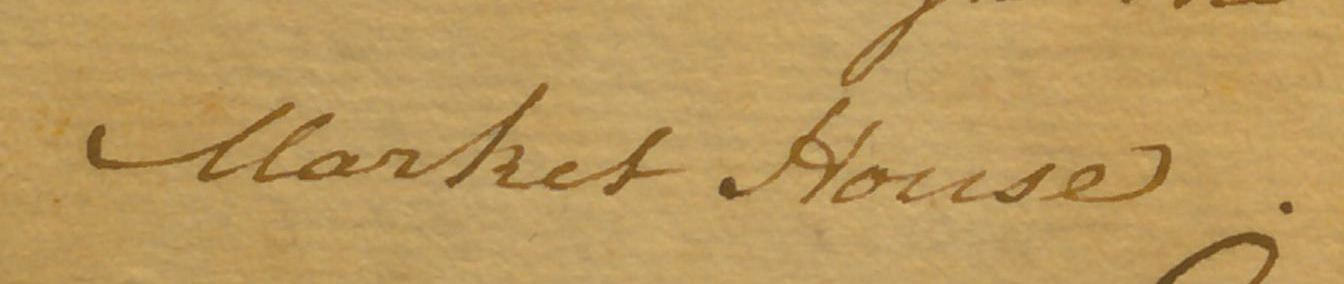Market House.
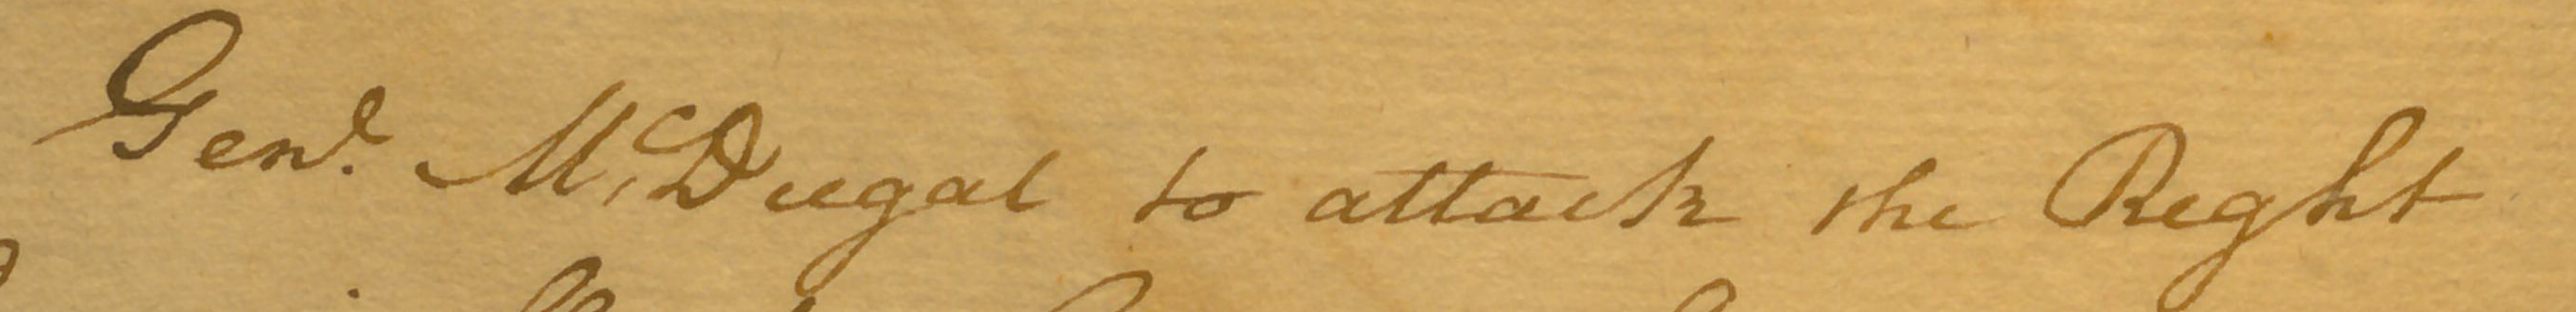Gen^l. M^cDugal to attack the Right
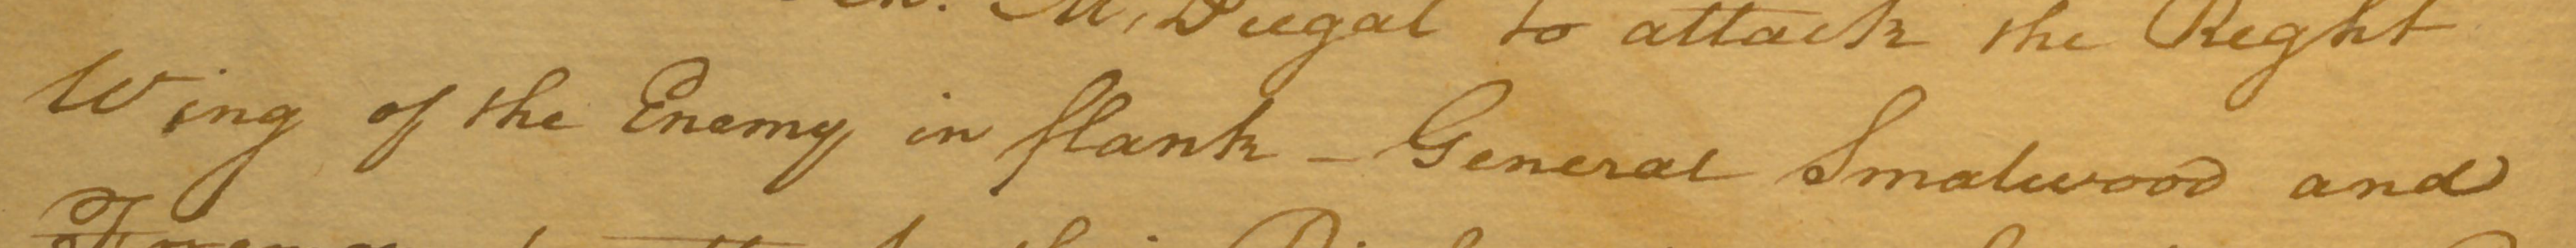Wing of the Enemy in flank- General Smalwood and
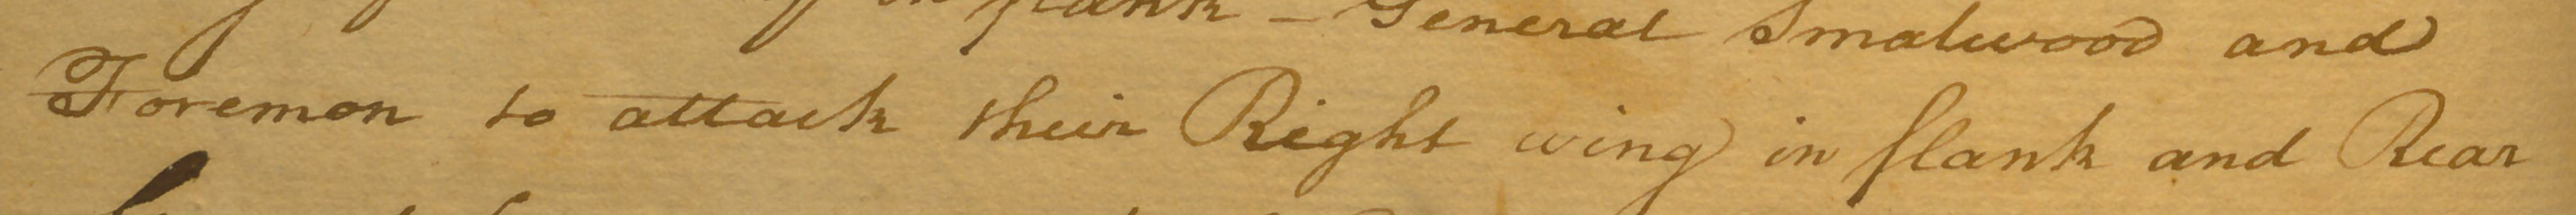Foreman to attack their Right wing in flank and Rear
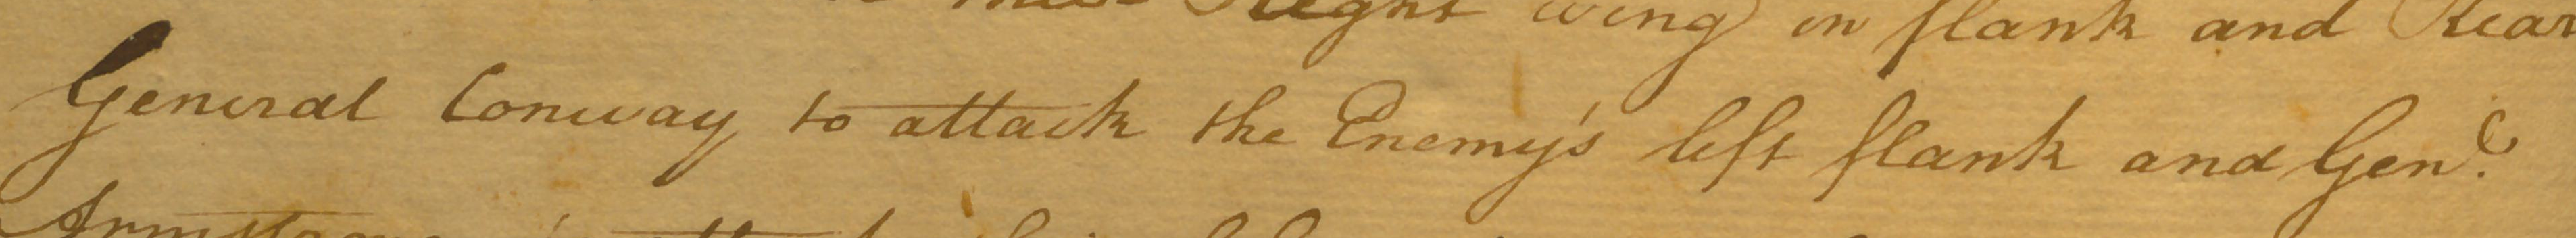General Conway to attack the Enemy's left flank and Gen^l.
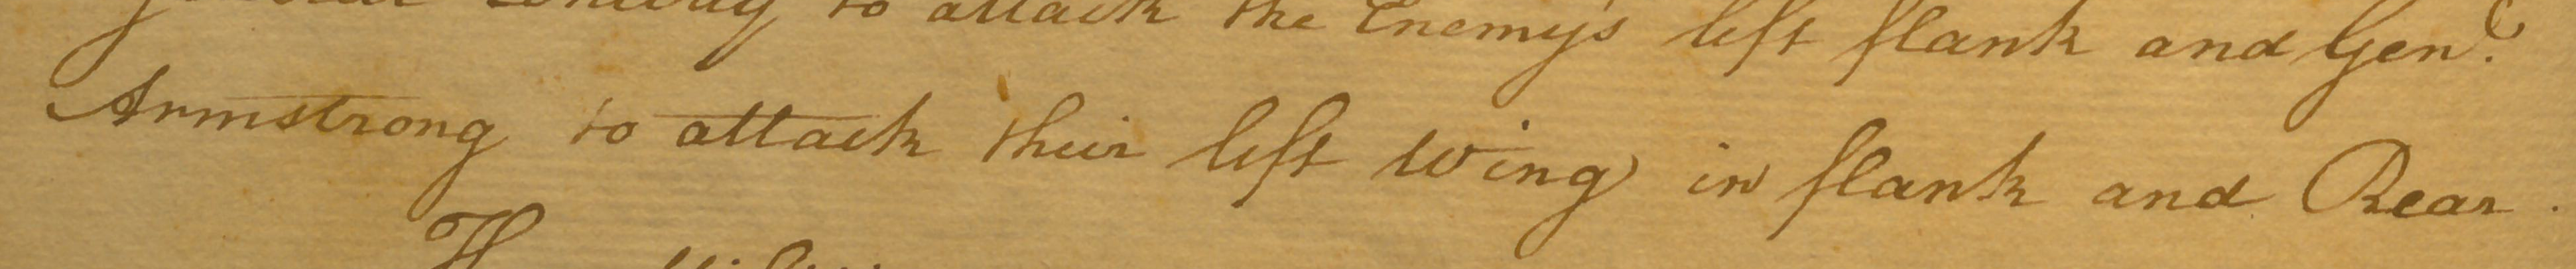Armstrong to attack their left wing in flank and Rear
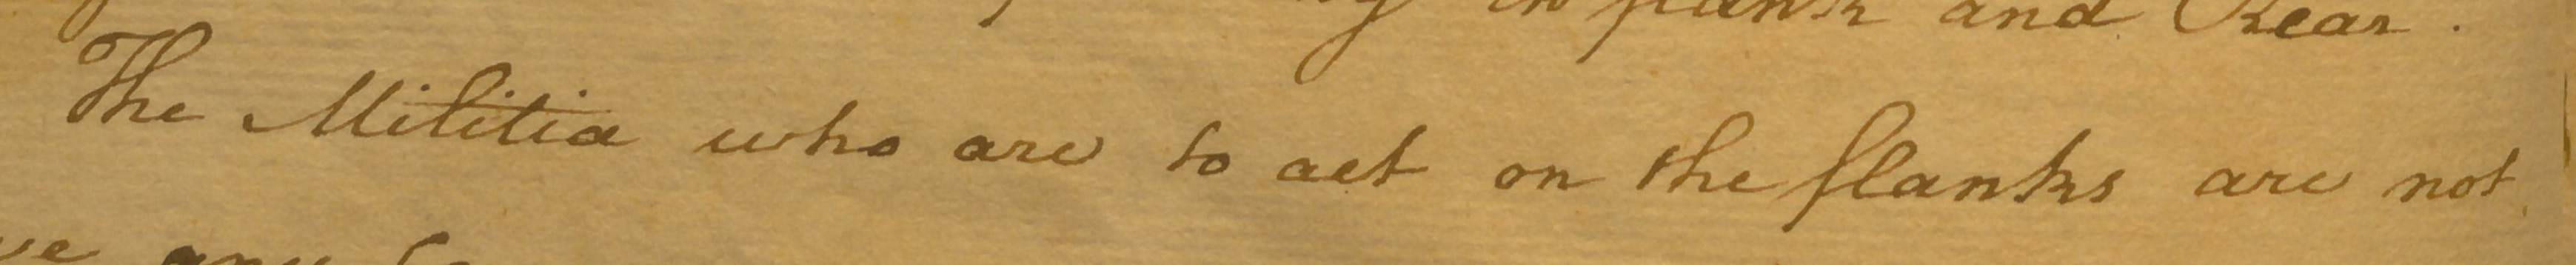The Militia who are to act on the flanks are not
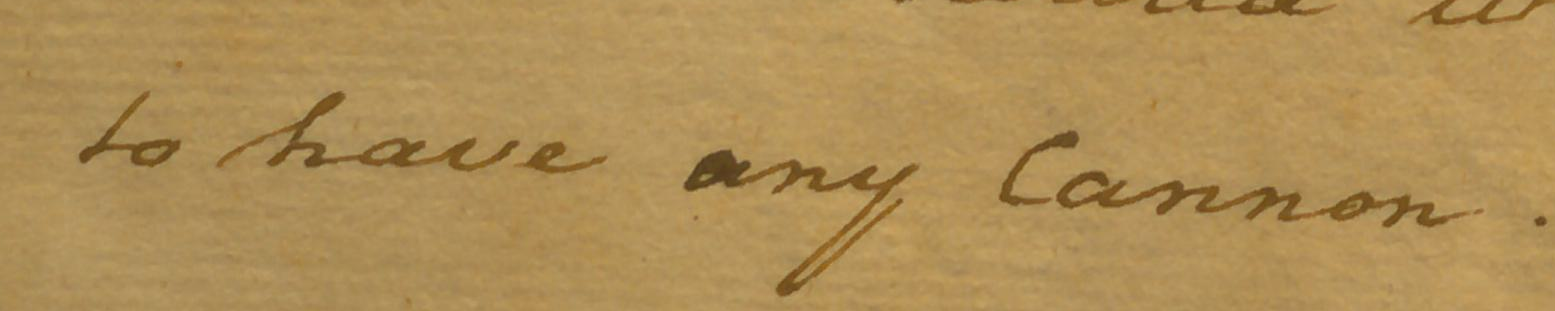to have any Cannon.
